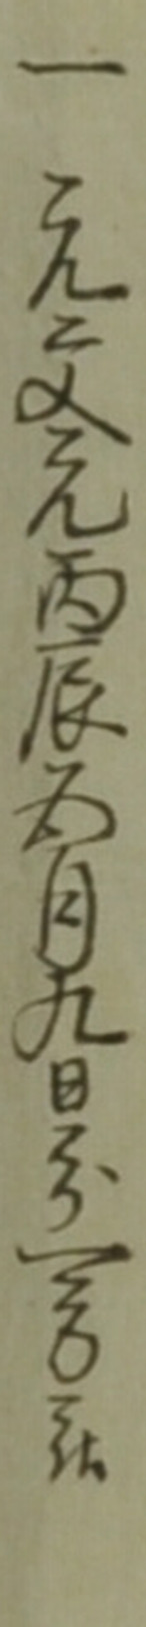一元文元丙辰五月九日分一方被
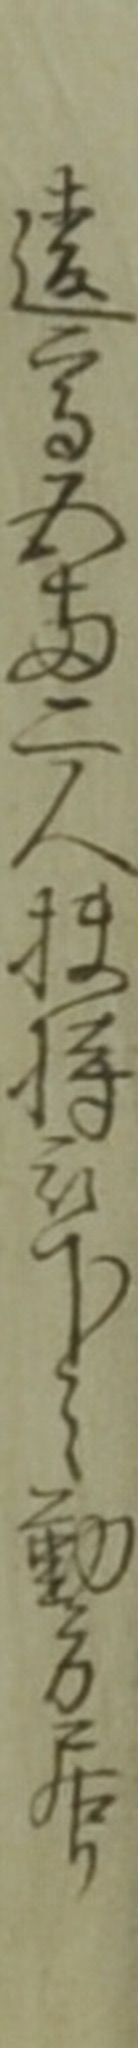違高五両二人扶持被下之勤方居り
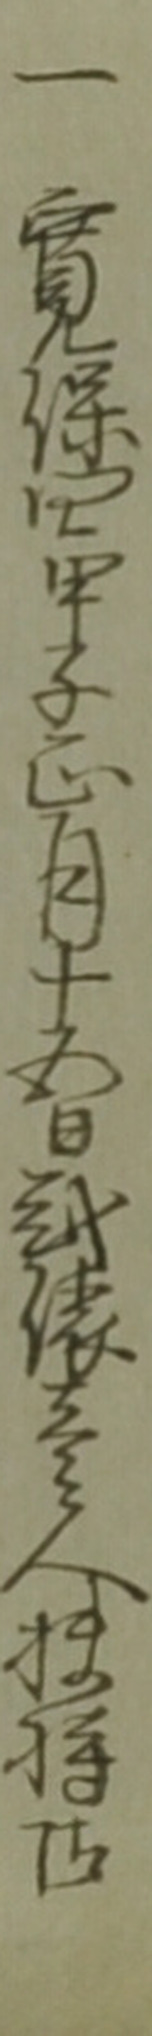一寛保四甲子正月十五日弐俵壱人扶持御
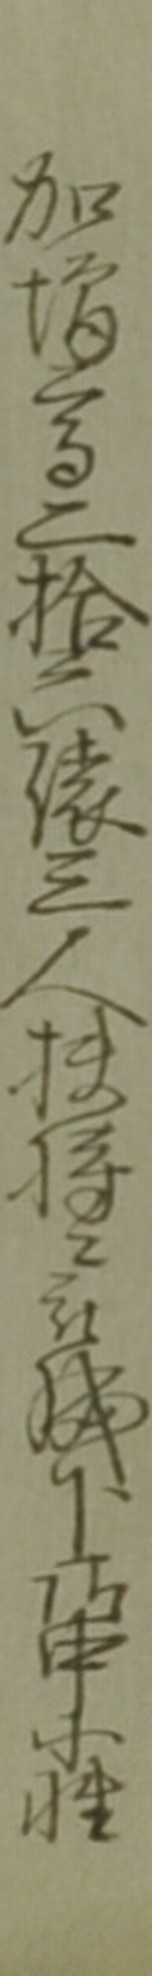加増高二拾六俵三人扶持ニ被成下御中小性
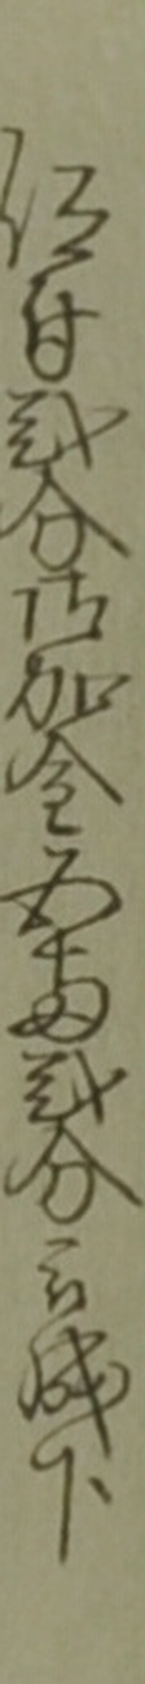仰付弐分御加金五両弐分被成下
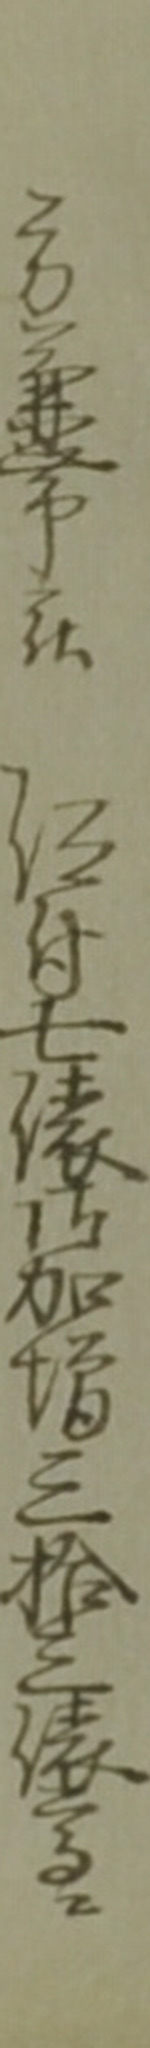方兼帯被仰付七俵御加増三拾三俵高ニ
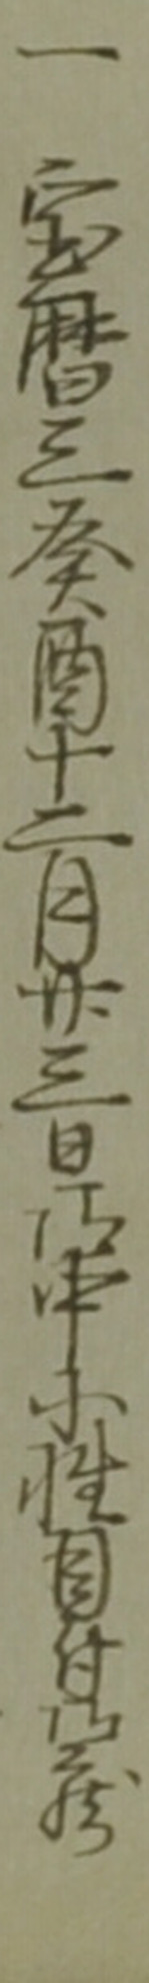一宝暦三癸酉十二月廿三日御中小性目付御蔵
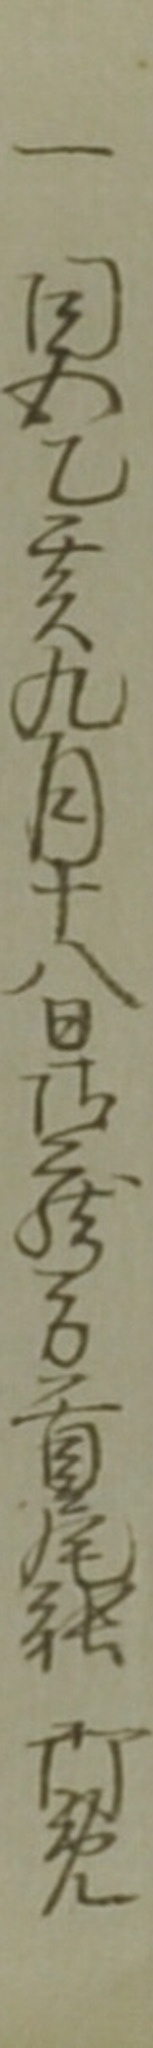一同五乙亥九月十八日御蔵方首尾能御免
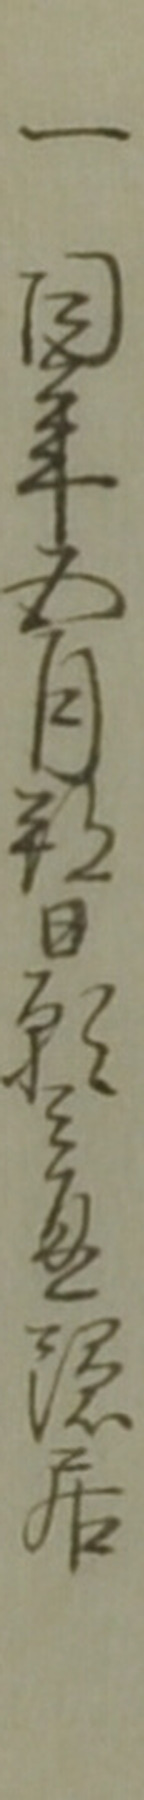一同年五月朔日願之通隠居
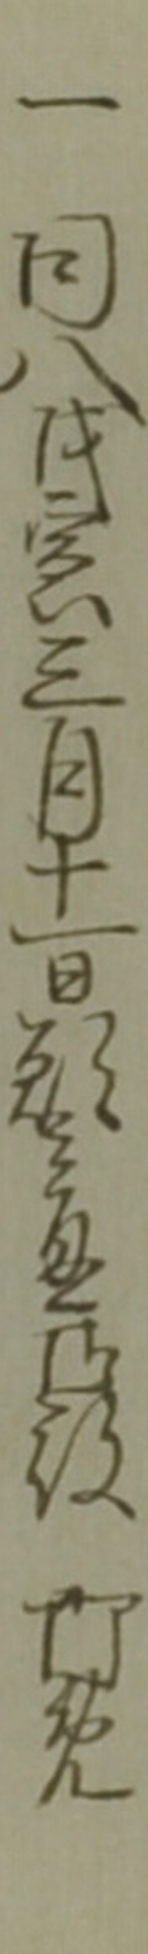一同八戊寅三月十一日願之通御役御免
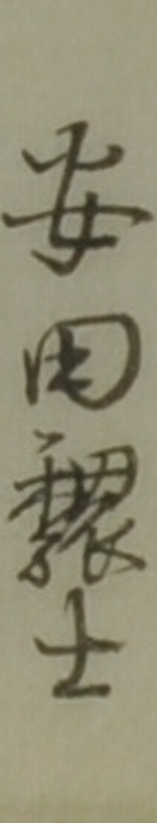安田魏士
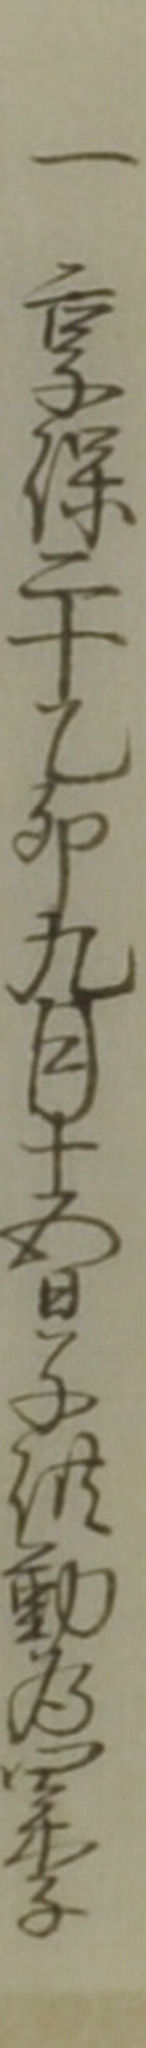一享保二十乙卯九月十五日子供勤為四季
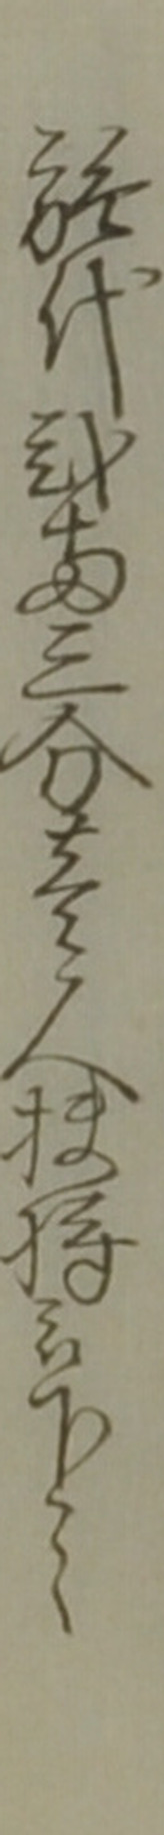施代弐両三分壱人扶持被下之
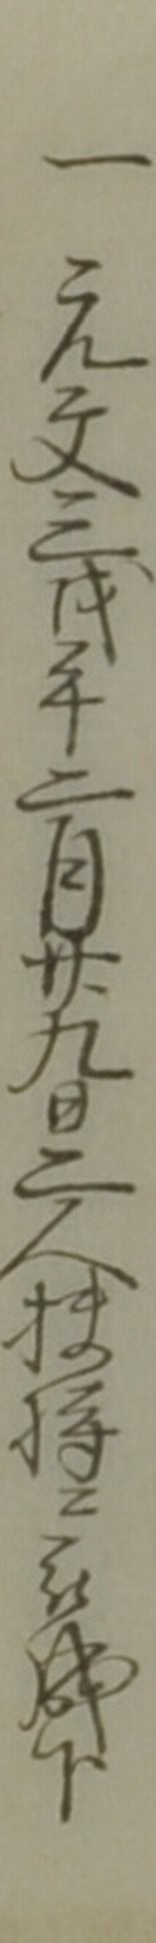一元文三戊午二月廿九日二人扶持ニ被成下
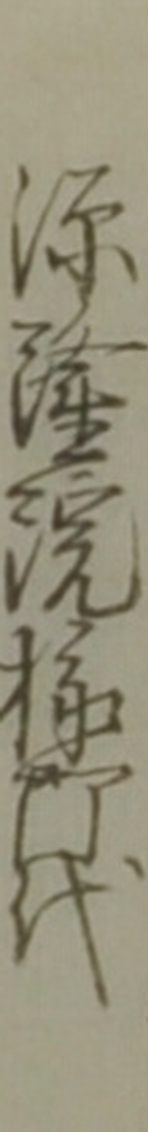源隆院様御代
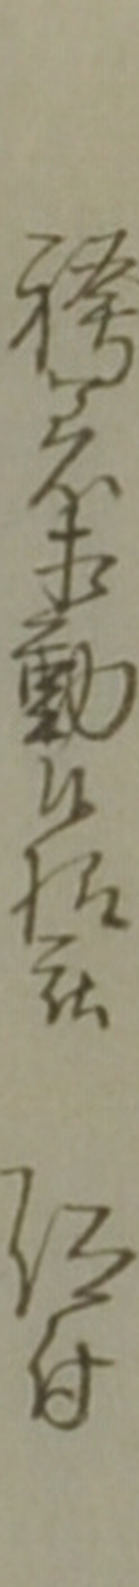袴着相勤候様被仰付
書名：無足諸士勤仕録（一）
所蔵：伊那市立高遠町図書館・合同会社AMANE
